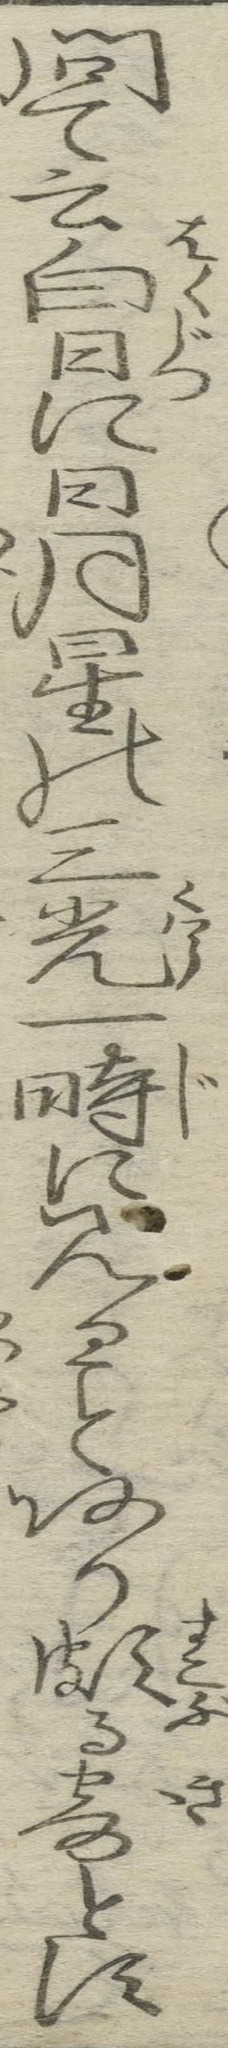問て云白日に日月星の三光一時に見ることあり頗る奇とす
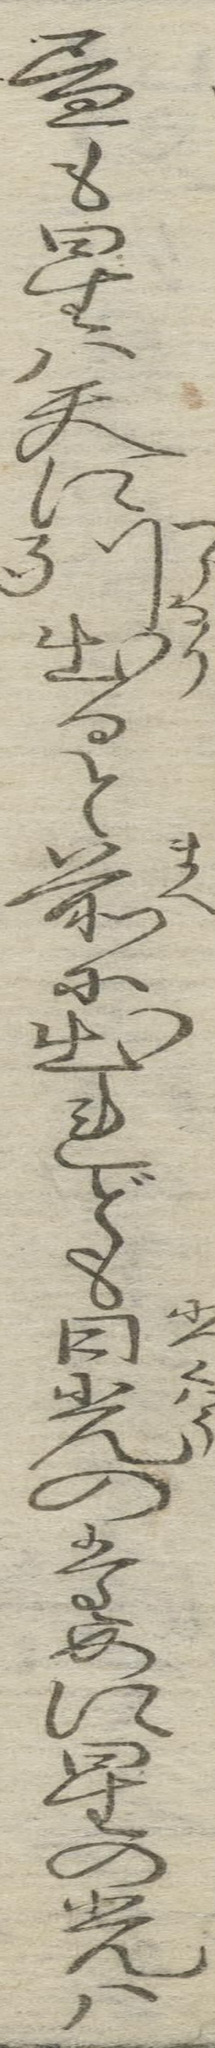昼も星は天に列出ると前に出れども日光のために星の光りは
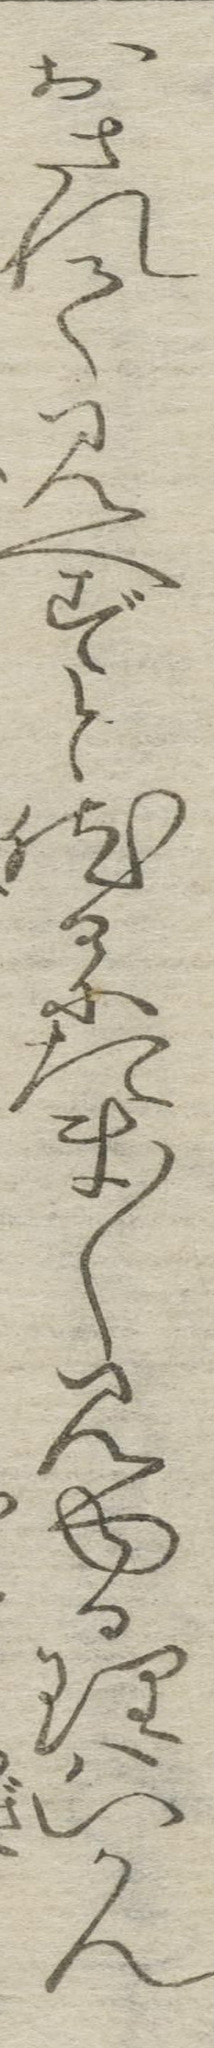おされて見へずと然るにたま〳〵見ゆる理はいかん
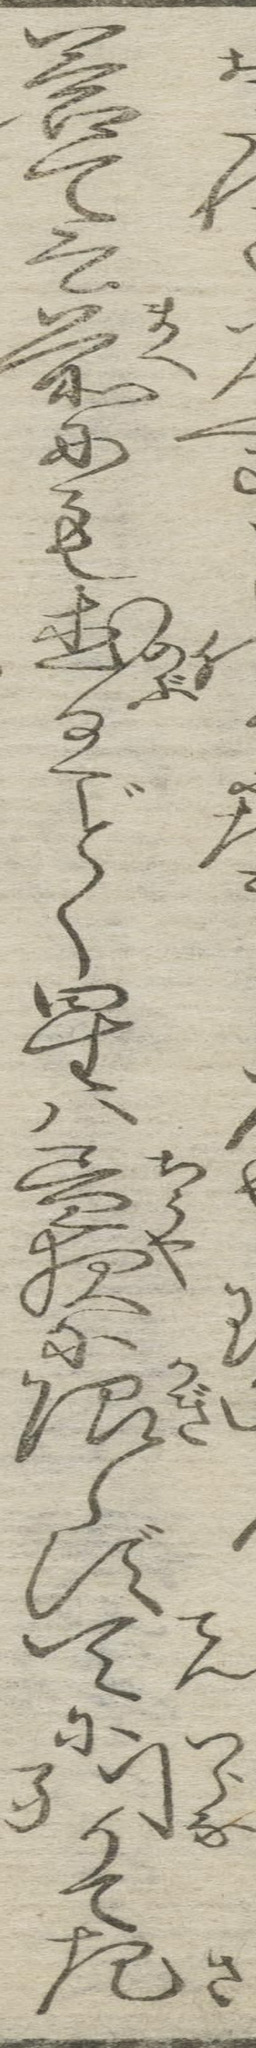答て云前にも述るごとく星は昼夜に限らず天に列りて左
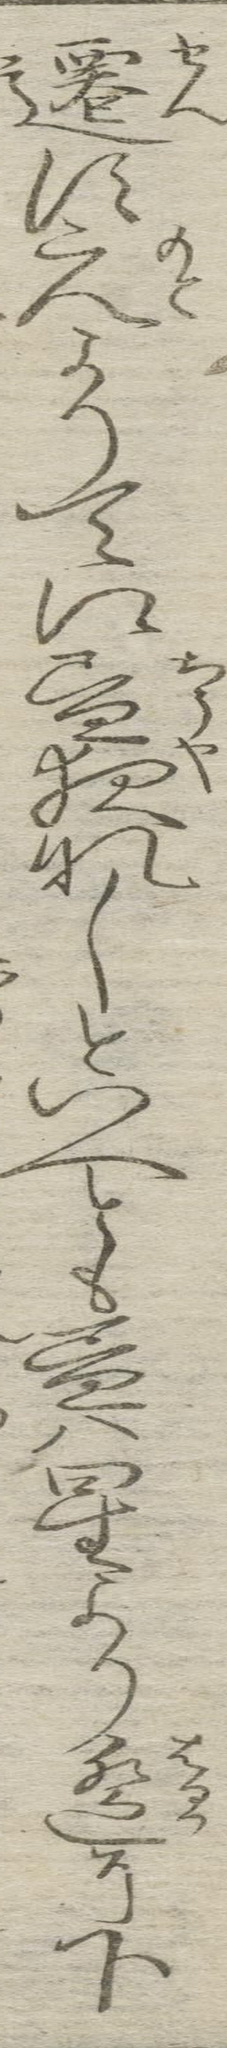遷す元より天に昼夜なしといへとも昼は星より遥に下
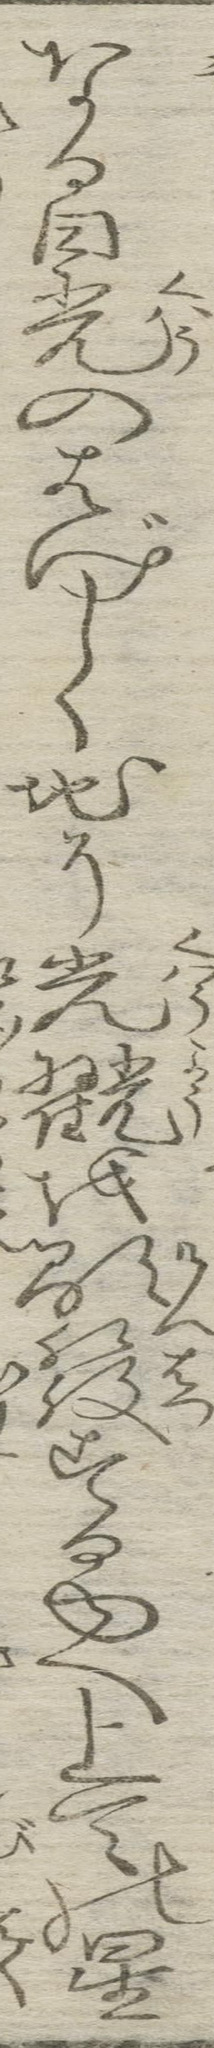なる日光のはげしく地に光耀を顕発するゆへ上天の星
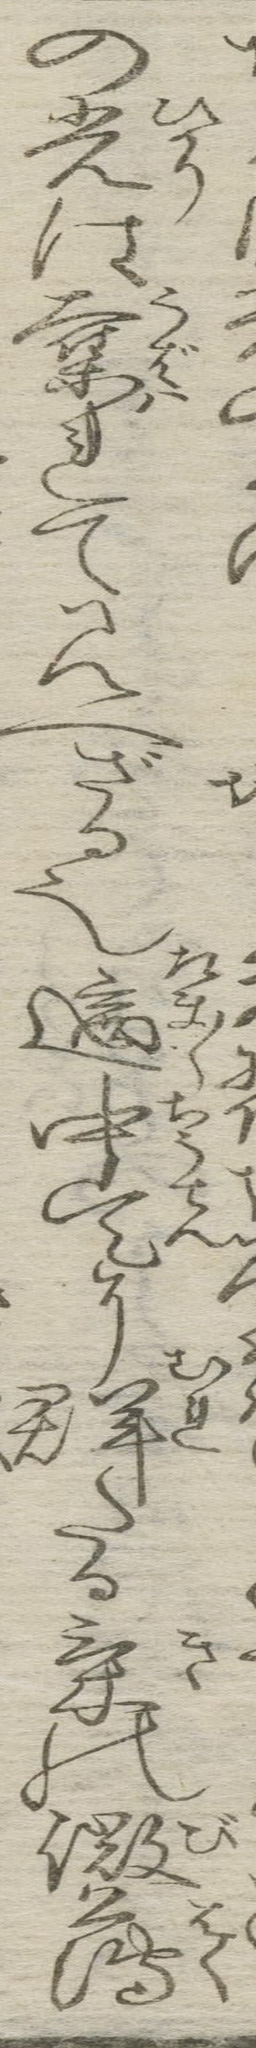の光は奪れて見へざる也適中天に群たる気の微薄
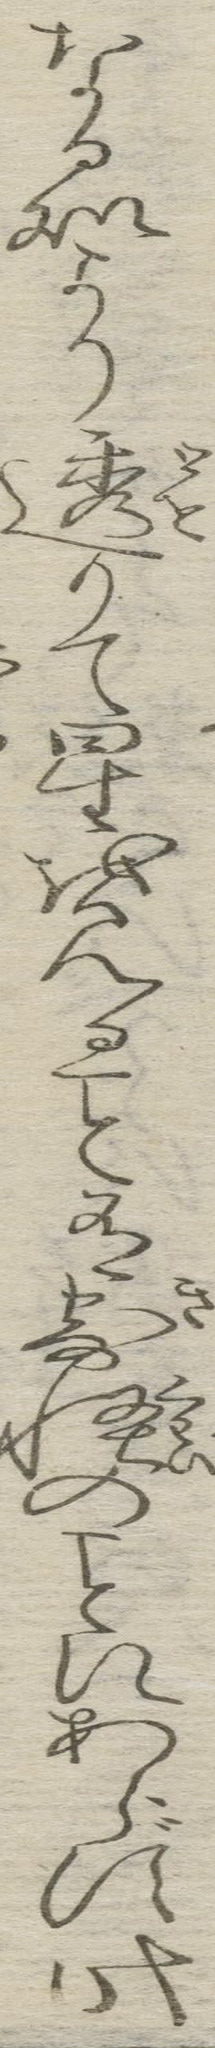なる処より透りて星を見ること有奇怪のことにあらず此
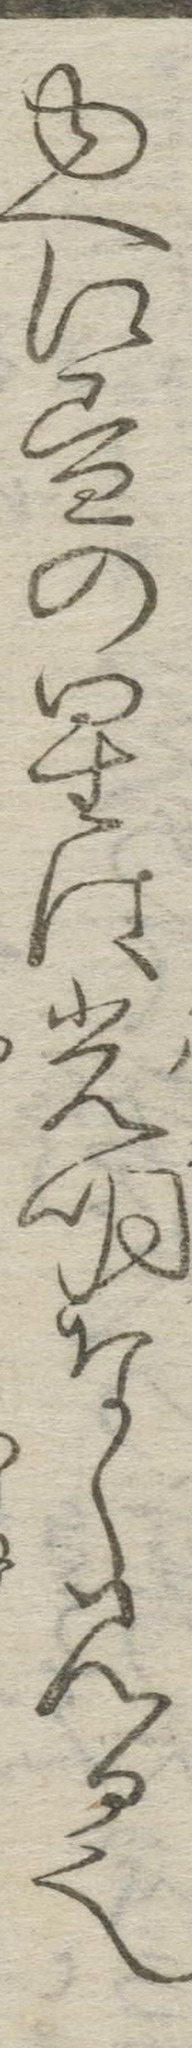ゆへに昼の星は光明なく見る也
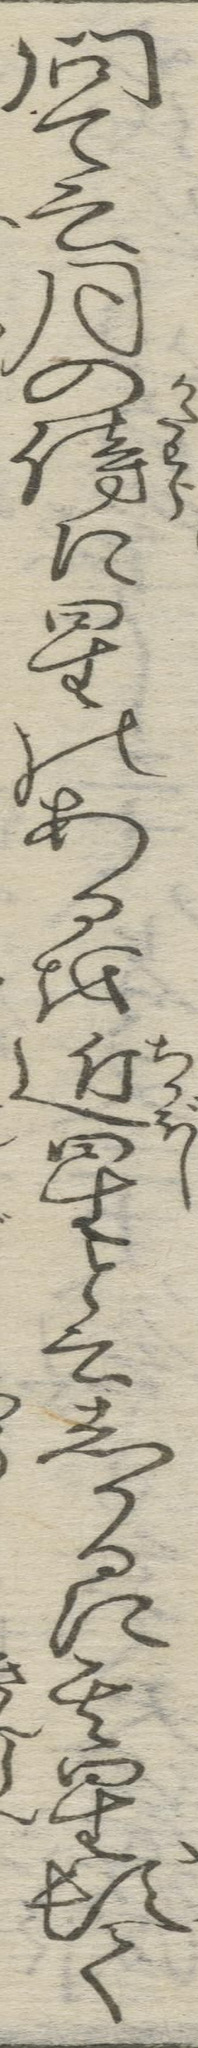問て云月の侍に星のあるを近星と云しかるに其星頓て
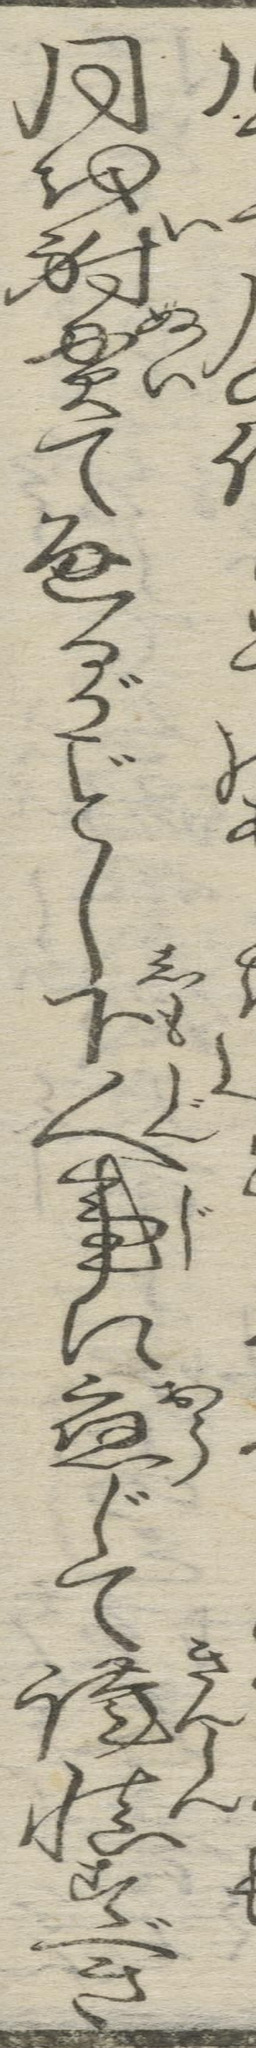月を射貫て通るがごとし下人事に応じて謹慎すべき
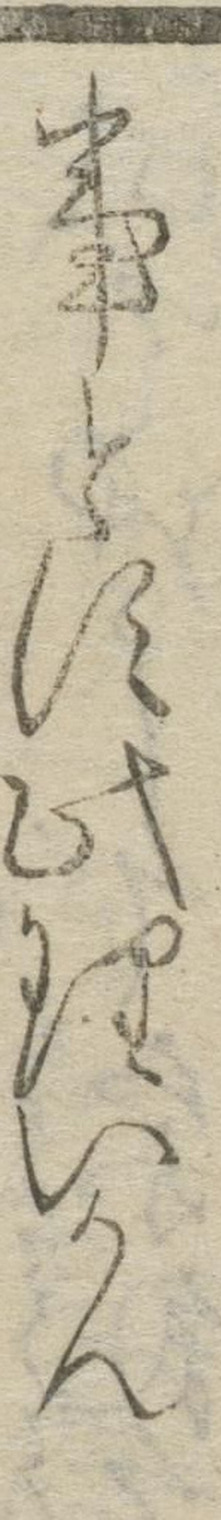事とす此理いかん
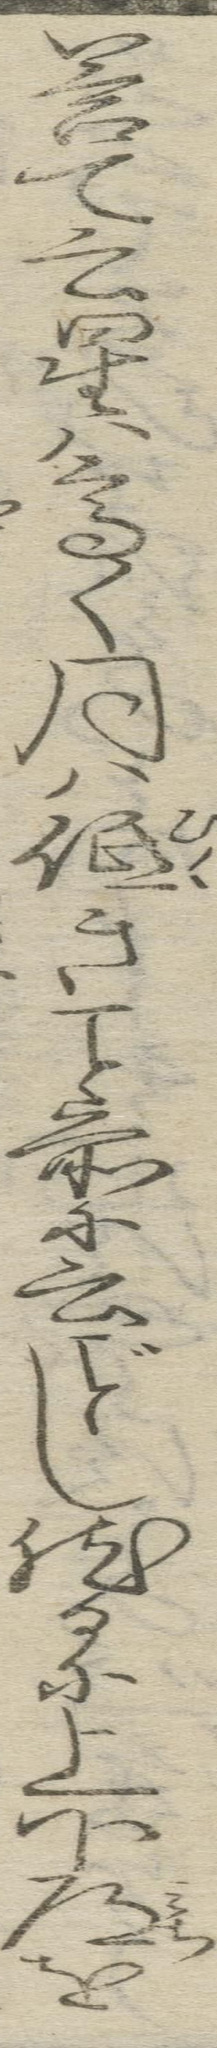答て云う星は高く月は低きこと前に云ごとし然るに上下道を
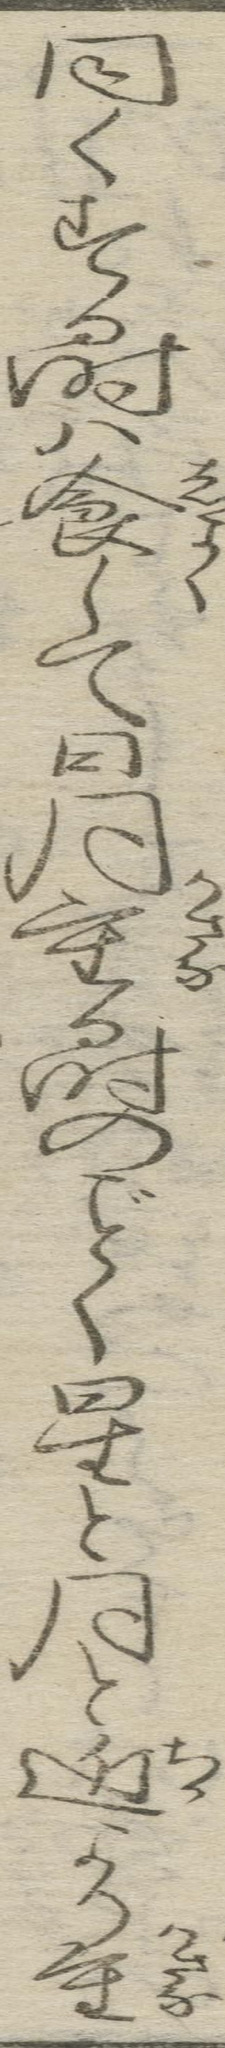同くする時は食して日月重る時のごとく星と月と近より重
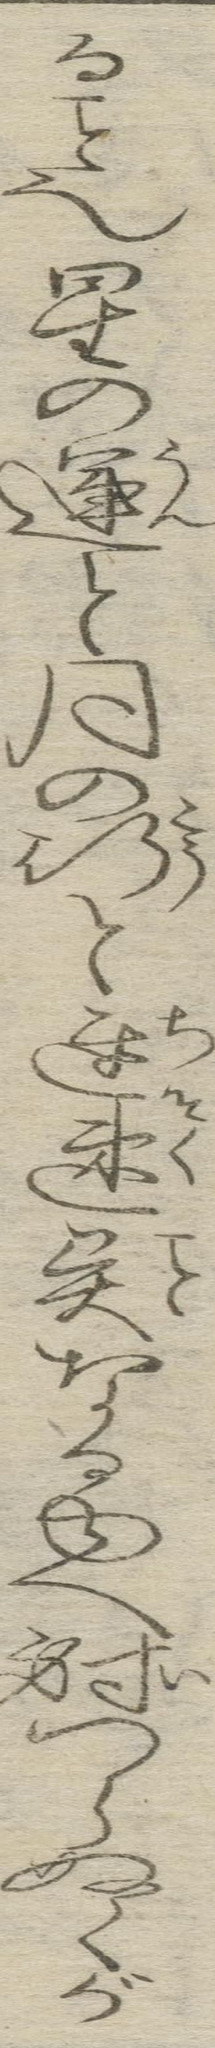ること也星の運と月の行と遅速異なるゆへ射つらぬくが
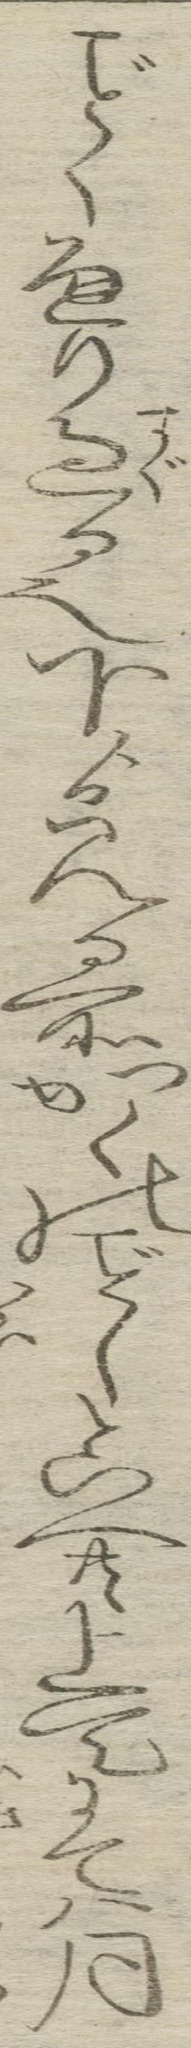ごとく通り過る也下ゟ見る所かくのごとしといへ共上天にては月
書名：訓蒙天地辨　天
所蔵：東京大学地震研究所図書室 Earthquake Research Institute Library, The University of Tokyo, JAPAN
